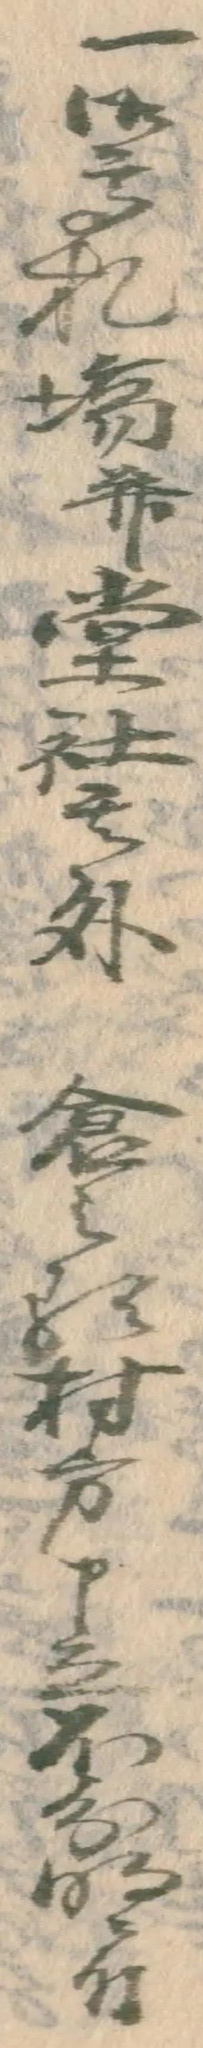一御高札場并堂社其外倉之類村方申立不分明二付
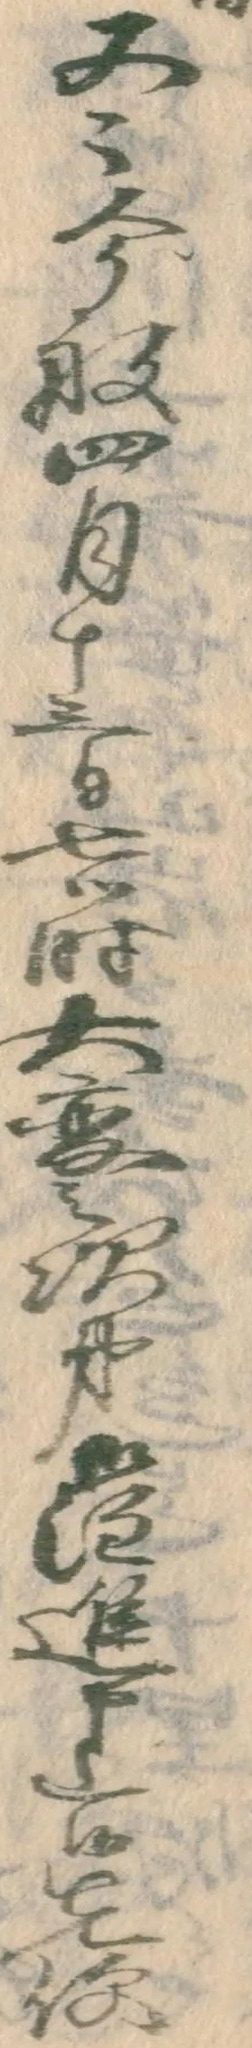又々今般四月十三日七ッ時大変之次第御注進申上候先便
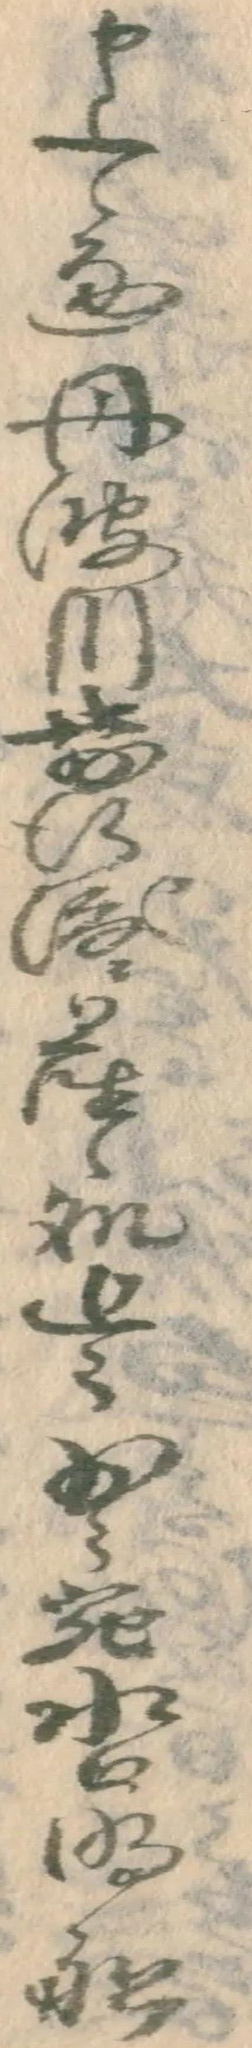申上候通丹波川歩行渡二御座候処追々少々宛水口明船
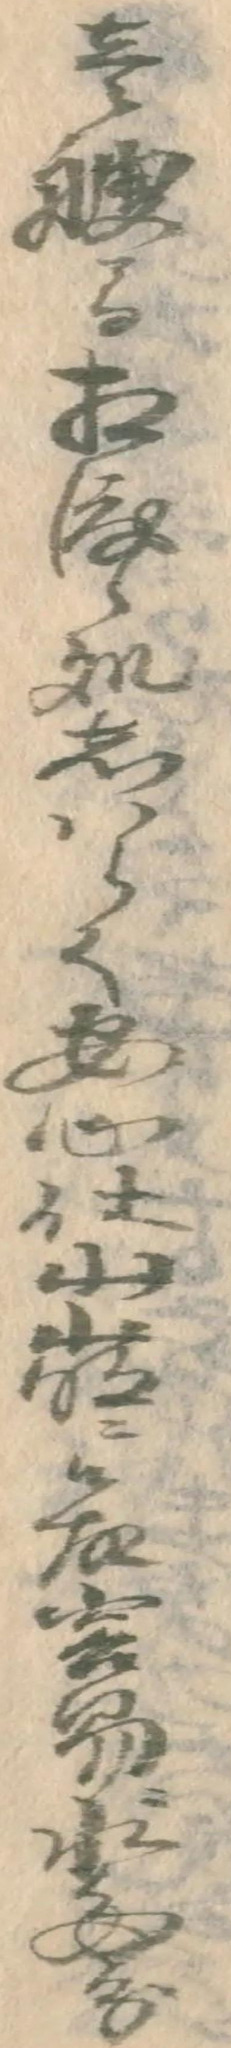壱艘二而相渡候処しハらく安心仕山崩二候故容易二水多分

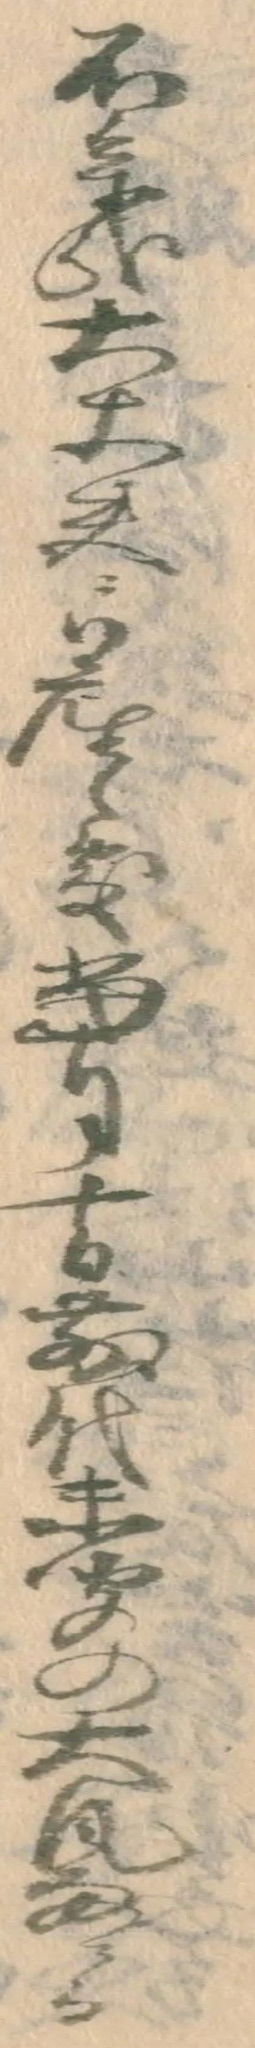不参哉大丈夫二御座候処当月十日前代未聞の大風雨二而
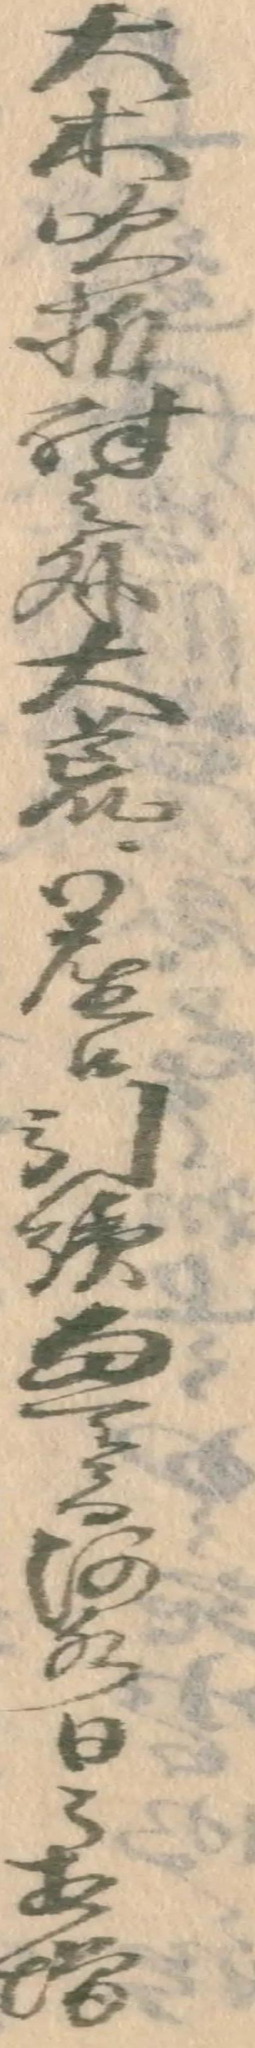大木吹折殊之外大荒二御座候引続雨天二而河水日々相増
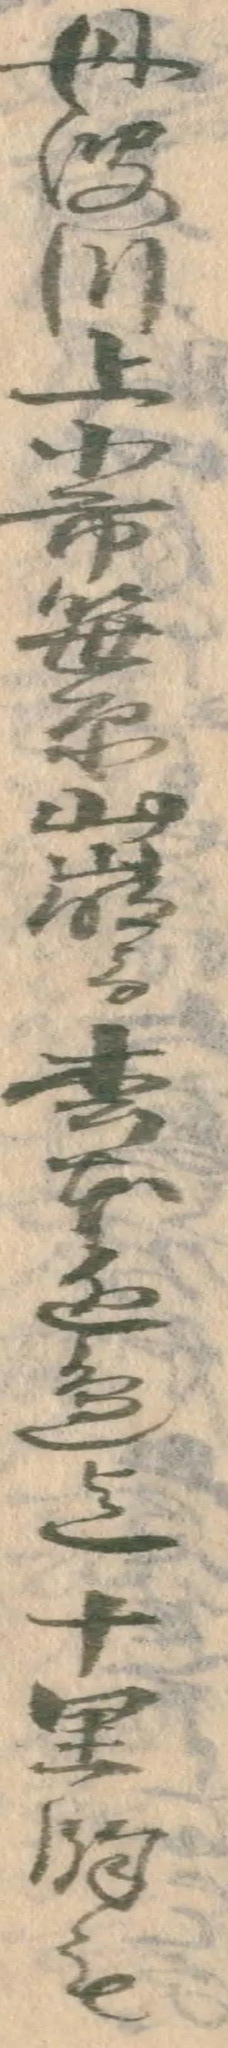丹波川上小市笹平山崩二而松本辺迄十里餘者
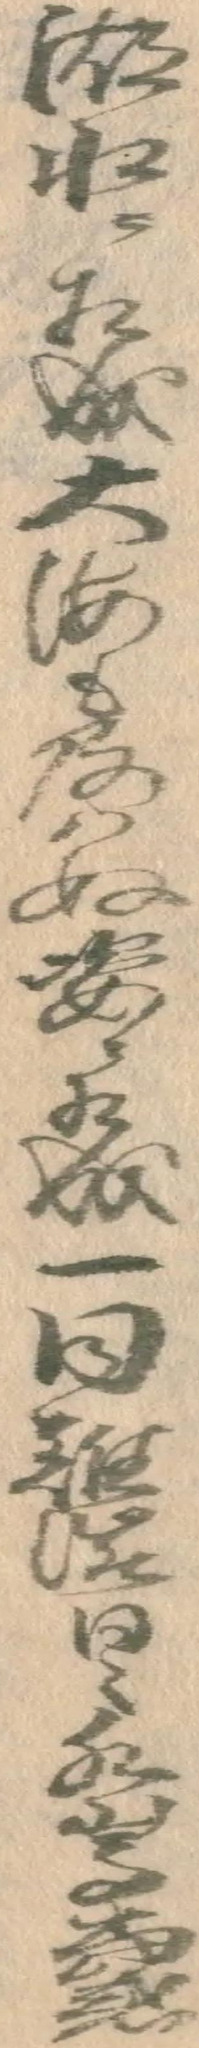湖水二相成大海も及ハぬ姿二相成一同難渋日々水嵩当惑
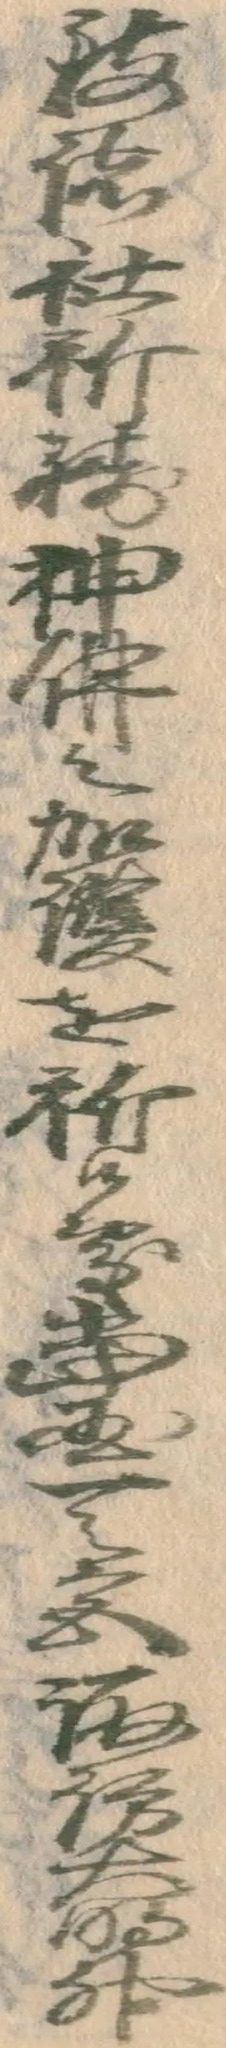致諸社祈祷神仏之加護を祈候処当国一之宮諏訪大明神
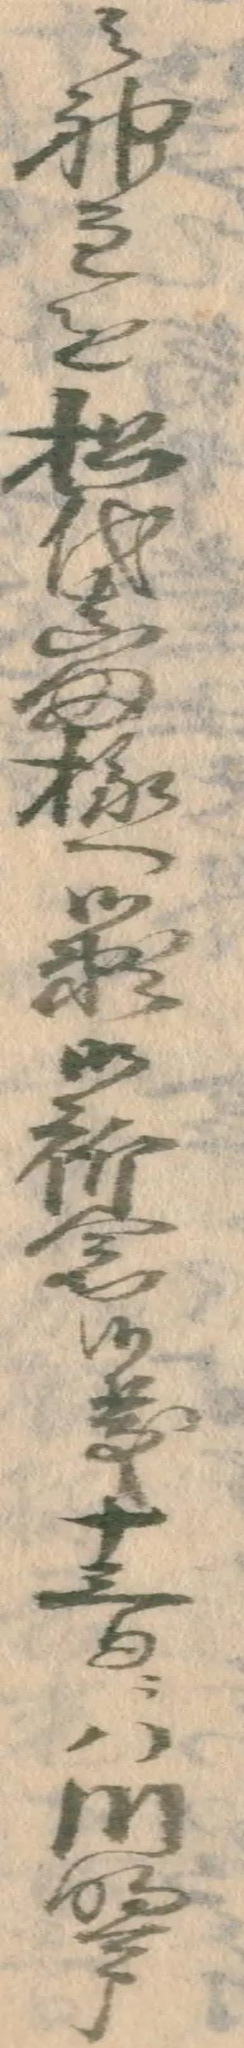之神主を松代真田様へ御頼御祈念候処十三日二ハ川明可申
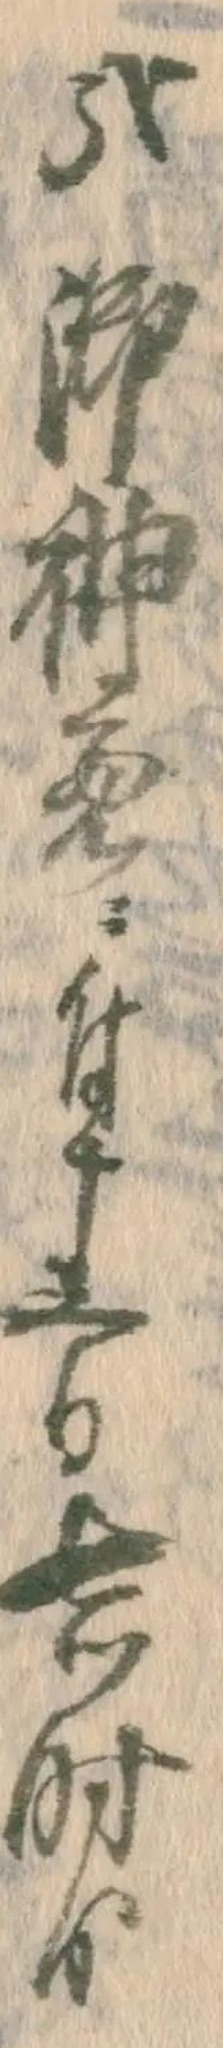哉御神免二付十三日七ッ時ゟ
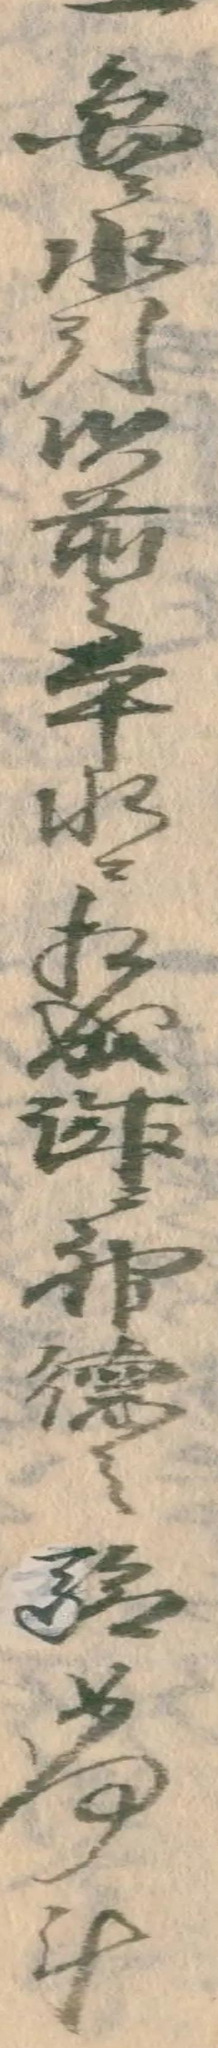一円二水引以前之平水二相成誠二神徳之験如何斗
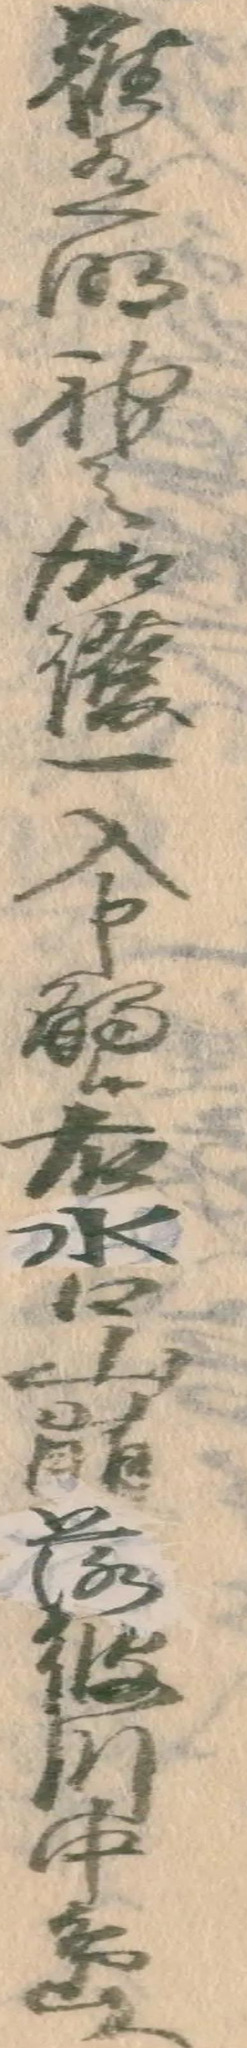難有明神之加護一入申触候右水口山崩落彼川中嶋へ
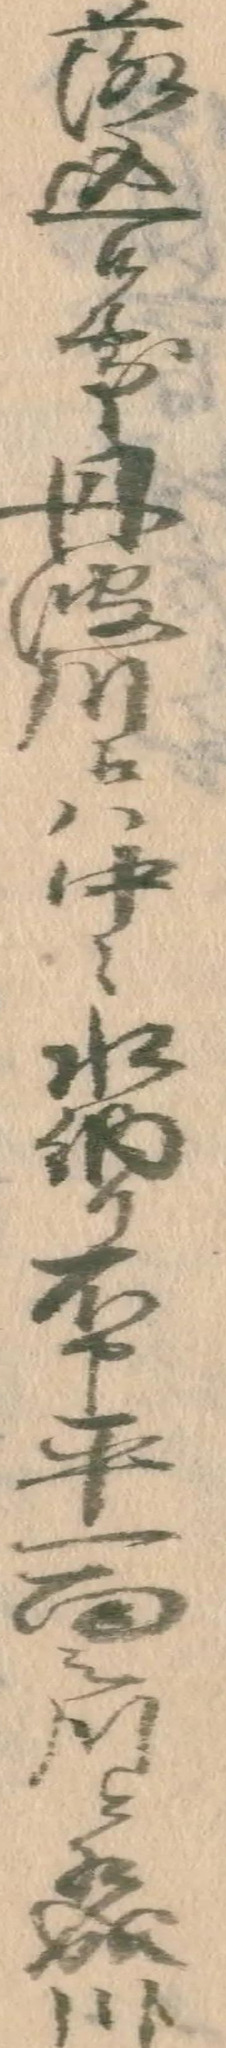落込候処丹波川江ハ中々水納不申平一面之川と相成川
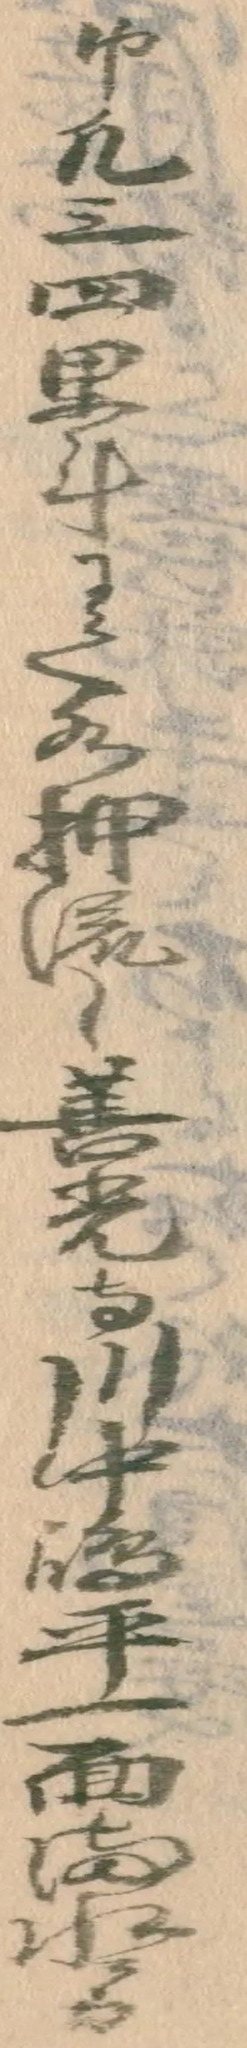巾凡三四里斗にて水押流し善光寺川中嶋平一面水二而
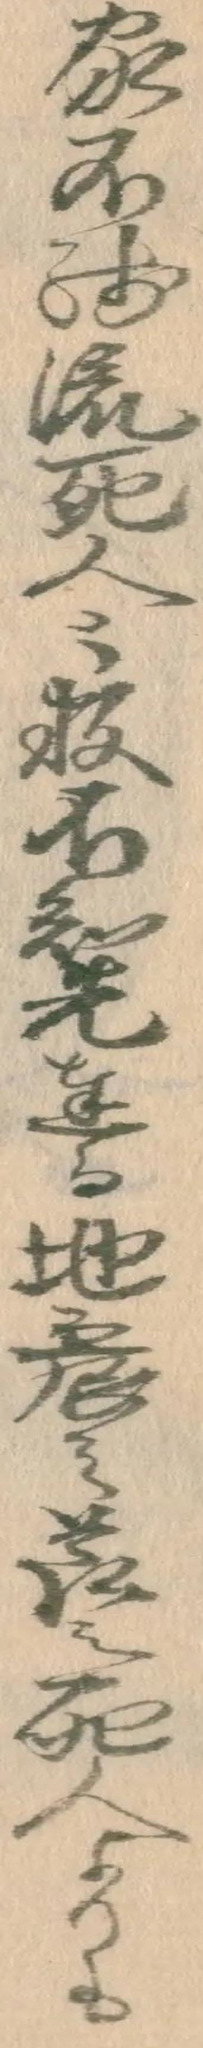家不残流死人之数不知先達而地震之節之死人よりも
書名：信州大地震之記
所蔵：国立国会図書館 National Diet Library, JAPAN
